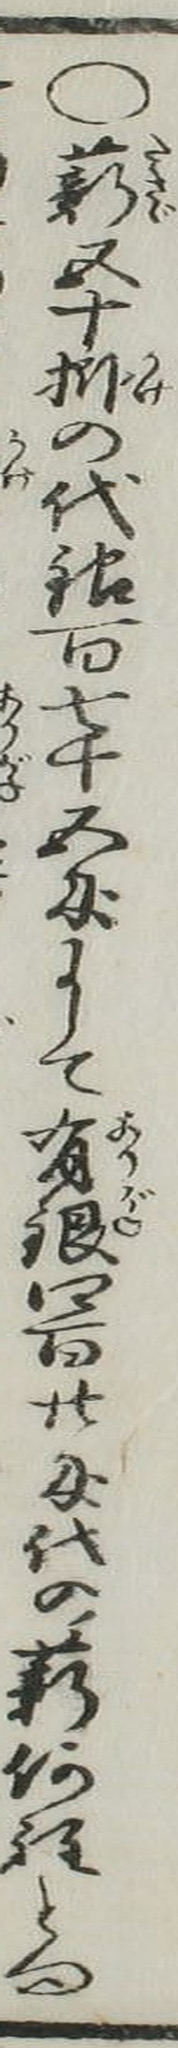○薪五十掛の代銀百七十五匁にして有銀四百廿匁代の薪何程と問
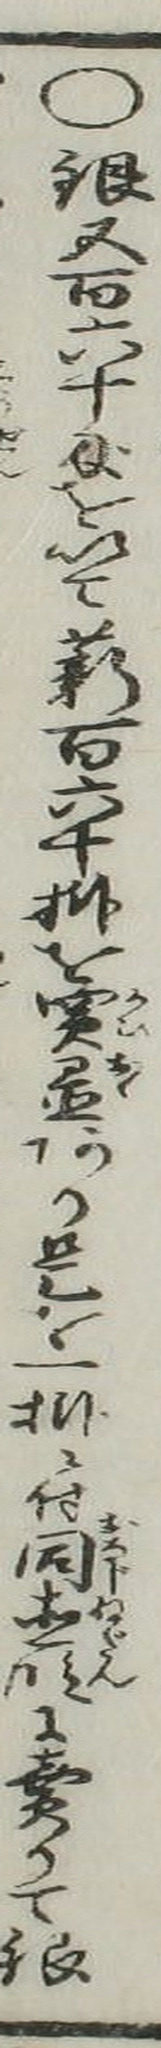○銀五百六十匁を以て薪百六十掛を買置あり是を一掛に付同直段に売りて銀
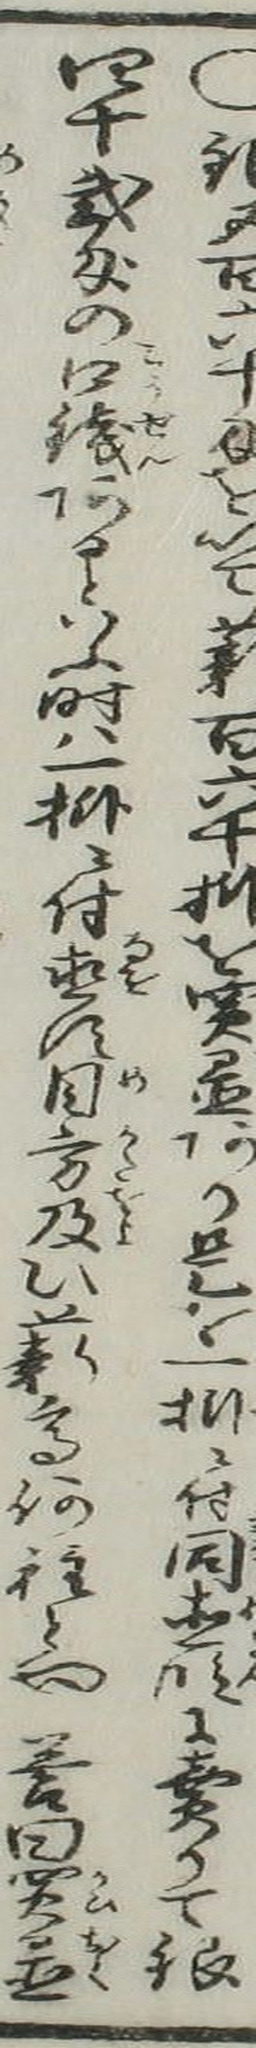四十弐匁の口銭あるといふ時は一掛に付直す目方及ひ薪高何程と問答曰買置
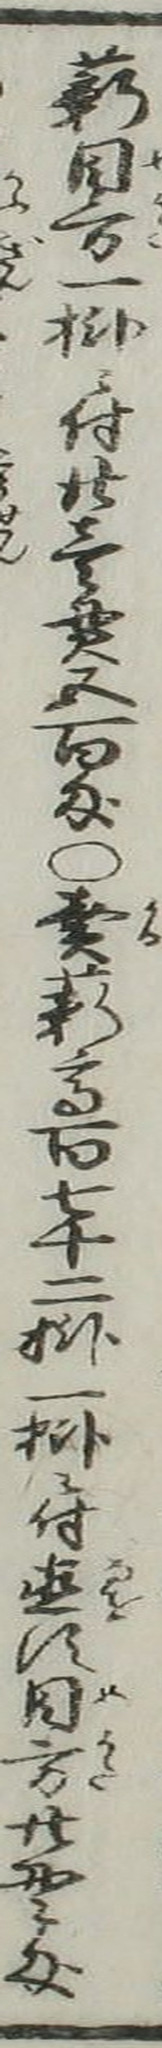薪目方一掛に付廿壱貫五百匁○売薪高百七十二掛一掛に付直す目方廿貫匁

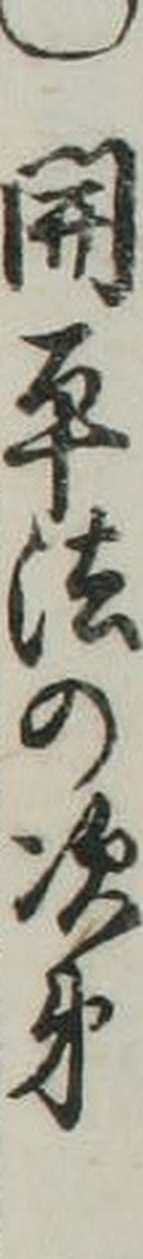○開平法の次第
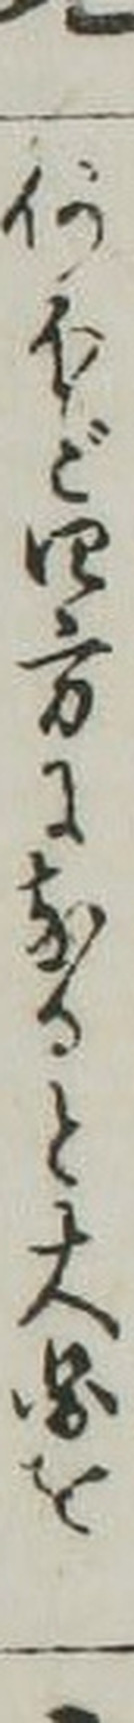何ほど四方になると大図を
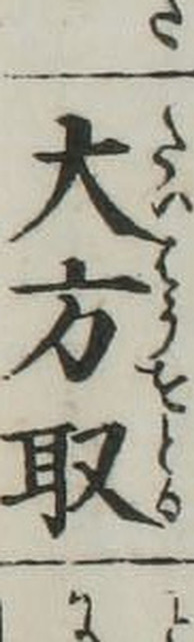大方◇
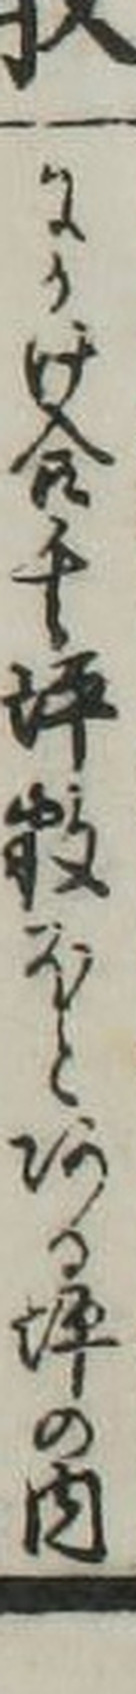にかけ合千坪数ほとある坪の内
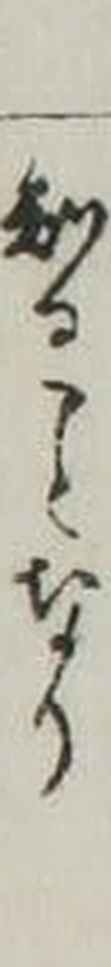知ることなり
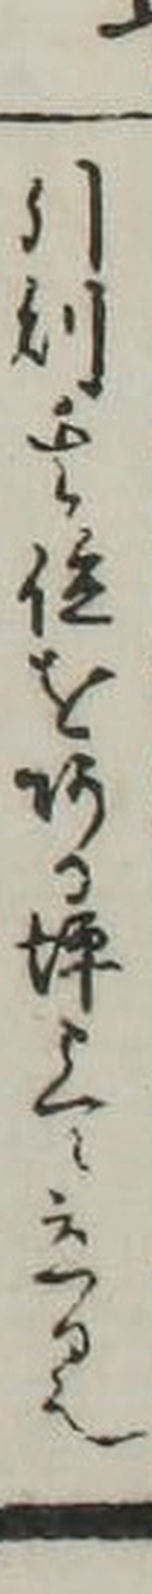引則其位をある坪上に立る也
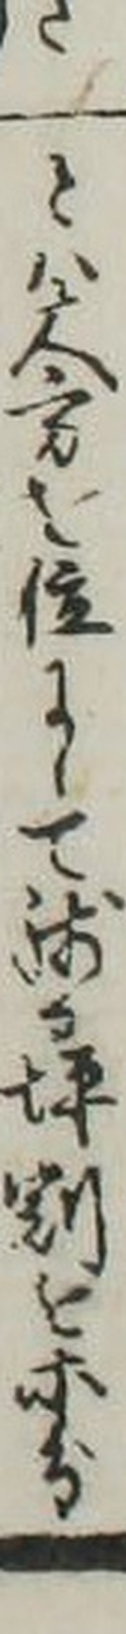角引とは大方を位にして残る坪割を等分
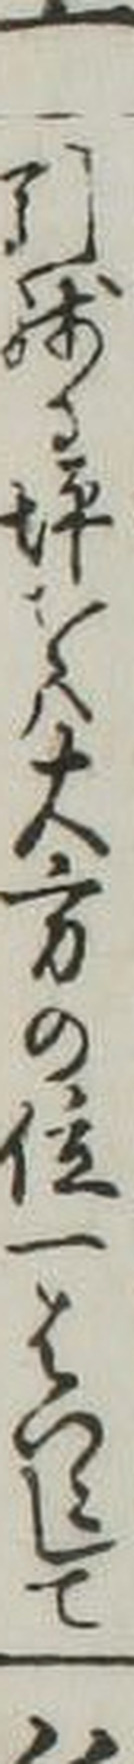引残る坪をは大方の位一はいにして
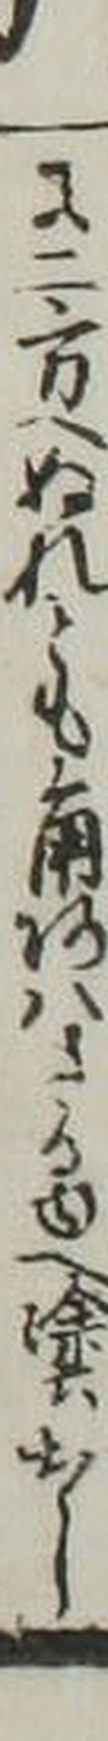に二方へぬれとも角あはさるゆへ塗出し
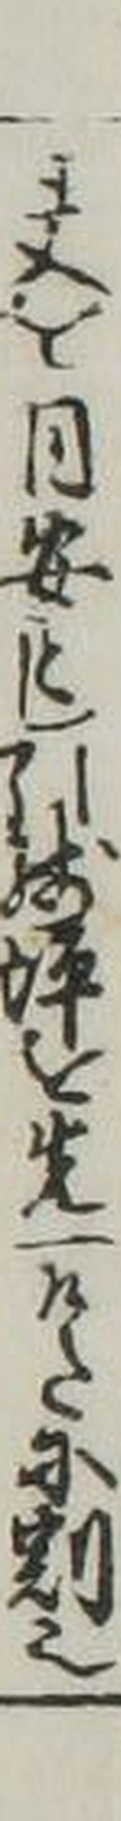夫を目安とし引残坪を先一けたに割也
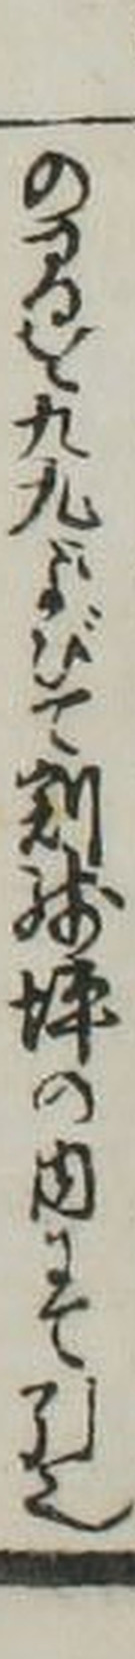の間を九九によびて割残坪の内にて引也
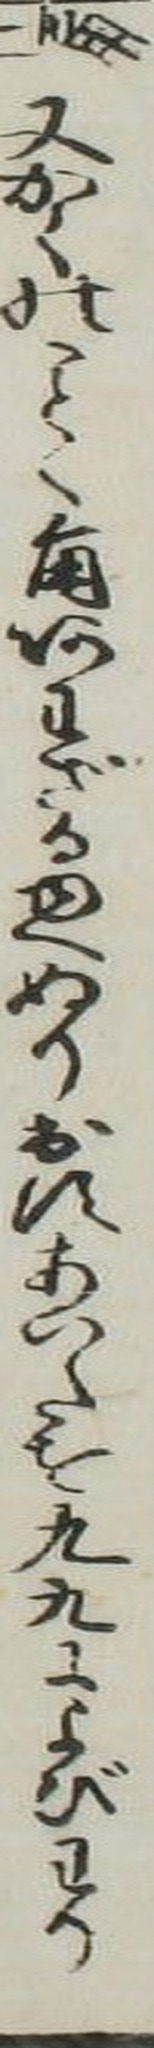大方た又かくのことく角あわざるゆへぬり出すあいたを九九によびわり
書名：宝玉塵劫記
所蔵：東京学芸大学教育コンテンツアーカイブ
